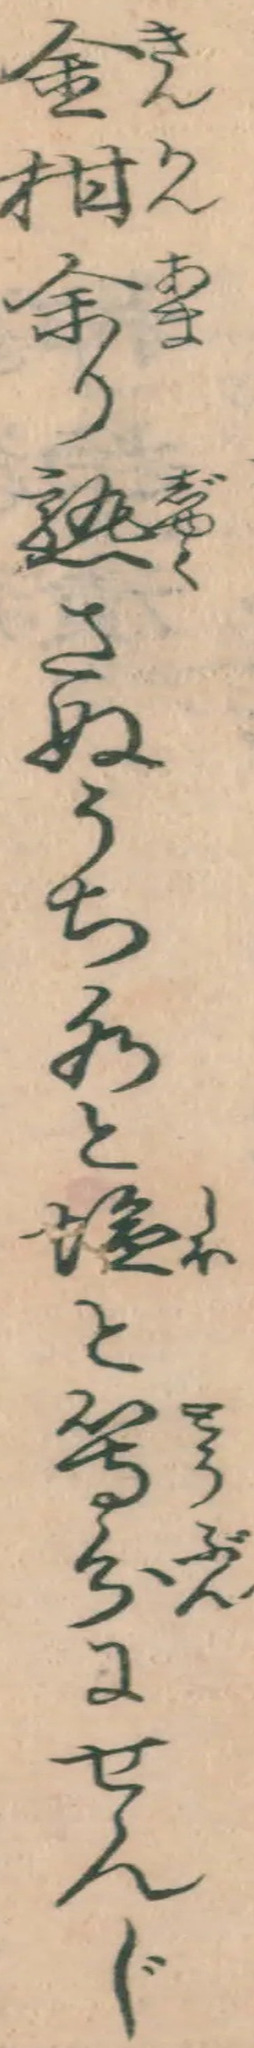金柑余り熟さぬうち水と塩と等分にせんじ
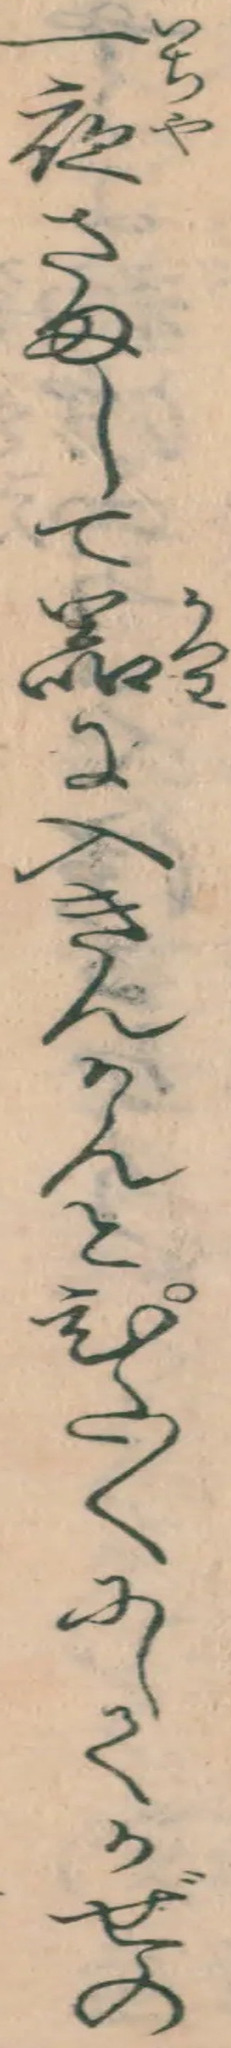一夜さまして器に入きんかんとぴた〳〵にしてかぜの
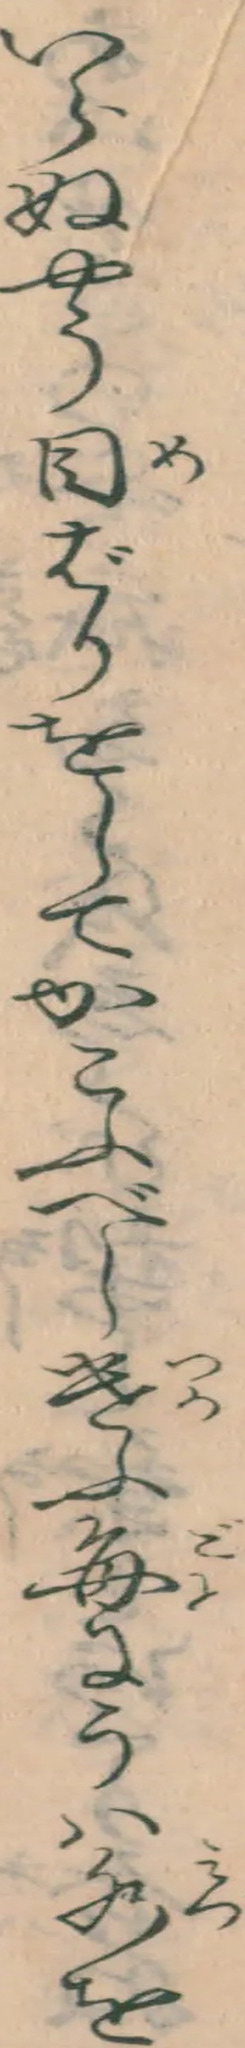いらぬやう目ばりをしてかこふべし遣ふ毎にうは水を
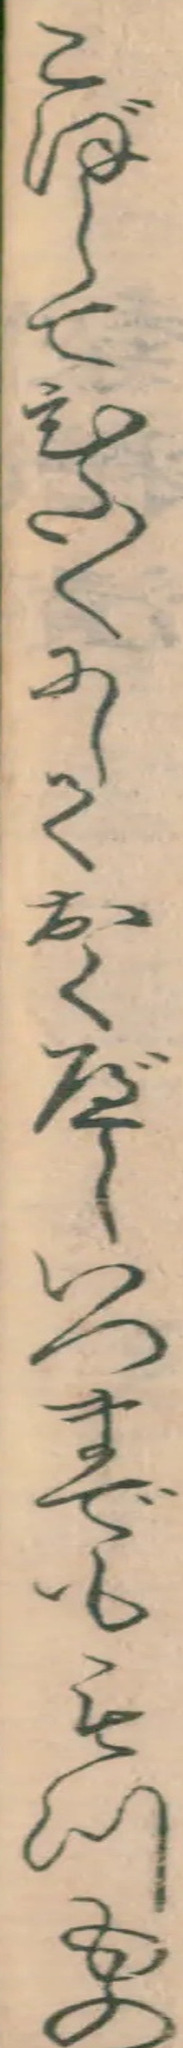こぼしてひた〳〵にしておくべしいつまでももつもの
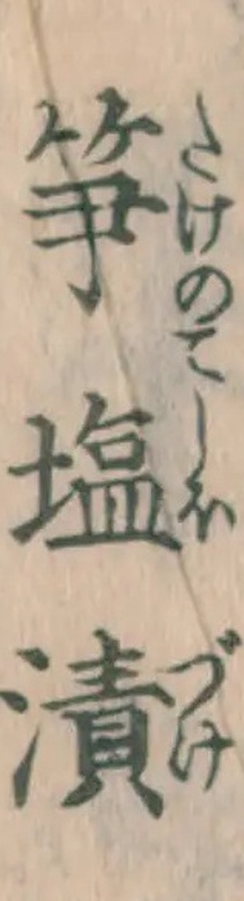笋塩漬
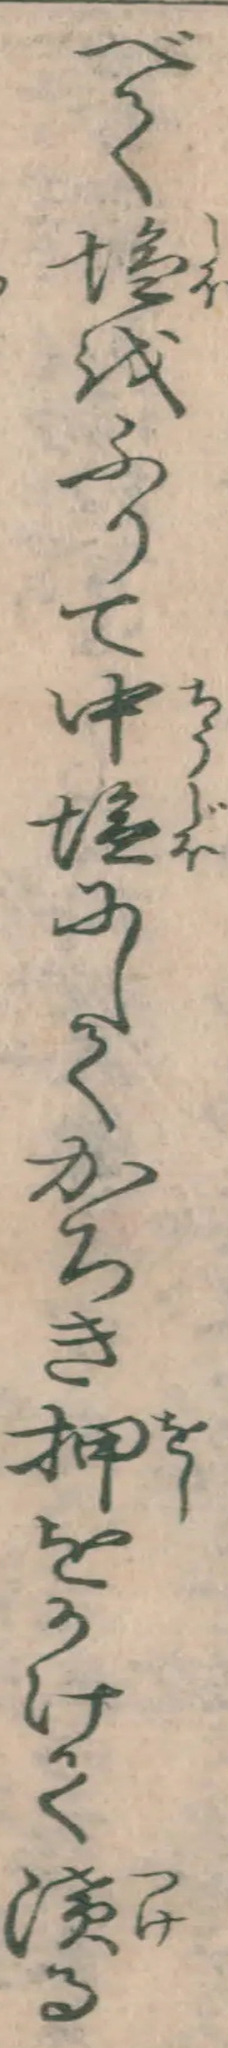べて塩をふりて中塩にしてかろき押をかけて漬る
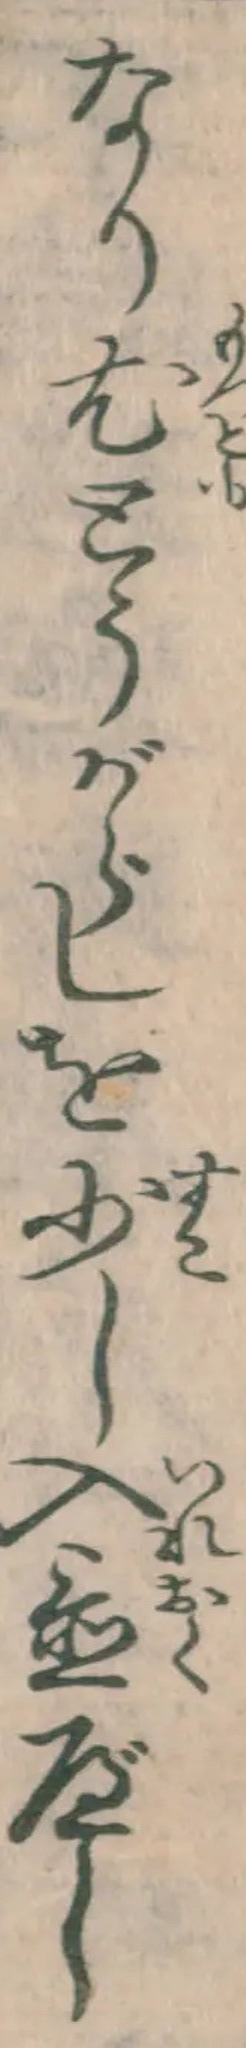なり尤とうがらしを少し入置べし
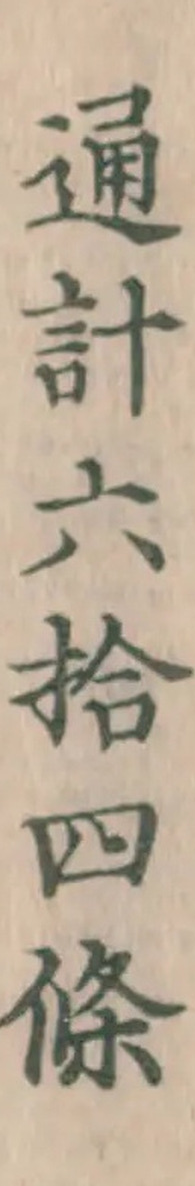通計六拾四條

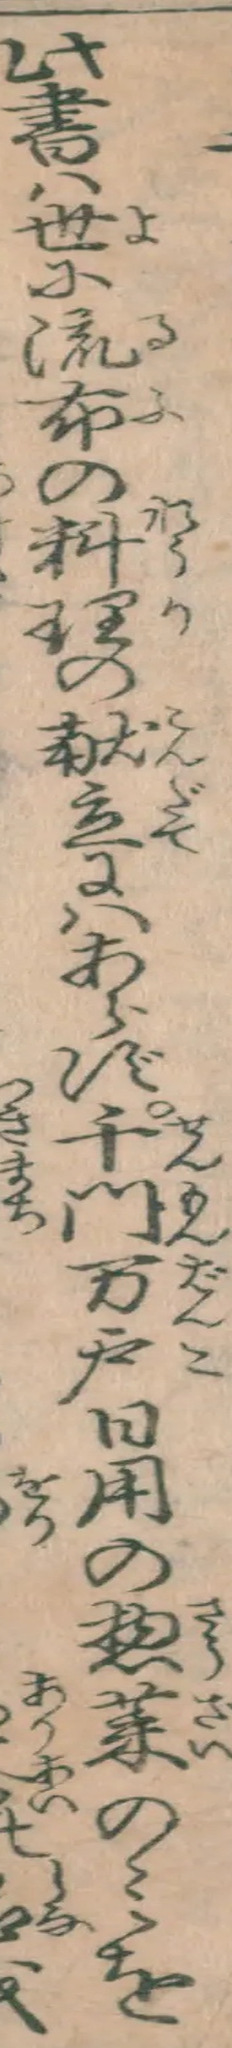此書は世に流布の料理の献立にはあらず。千門万戸日用の惣菜のみを
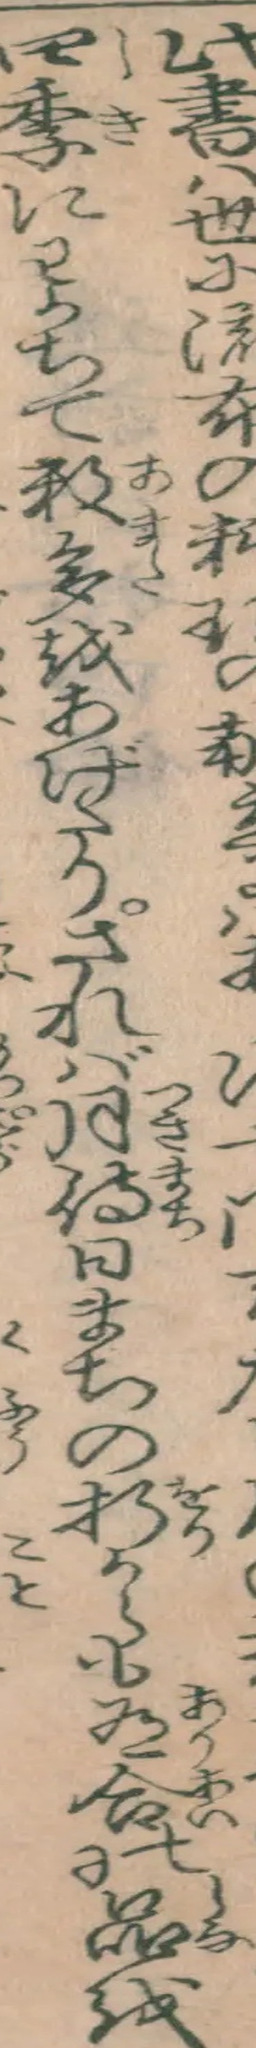四季にわかちて数多をあげたり。されば月待日まちの折からも有合の品を
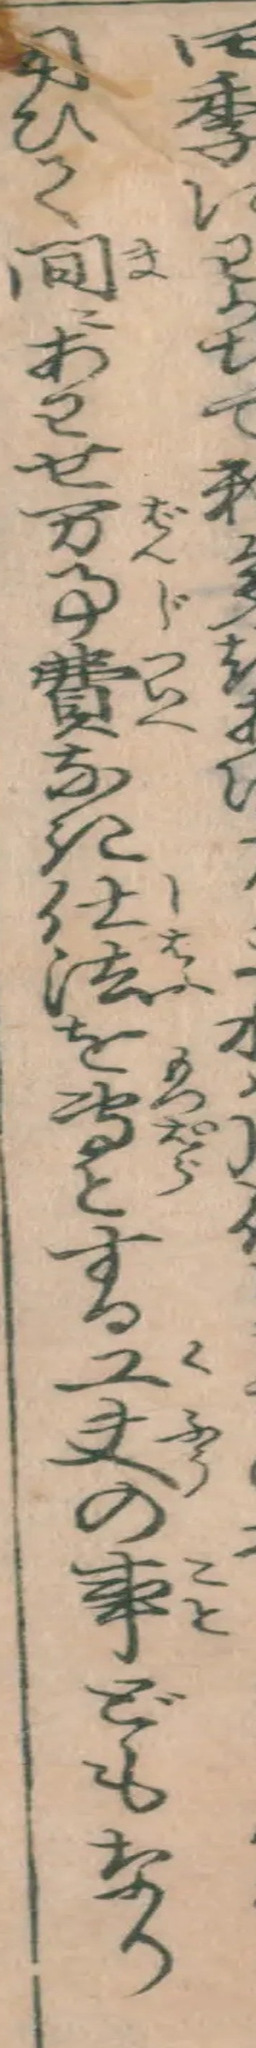用ひて間にあわせ万事費なき仕法を専とする工夫の事どもなり
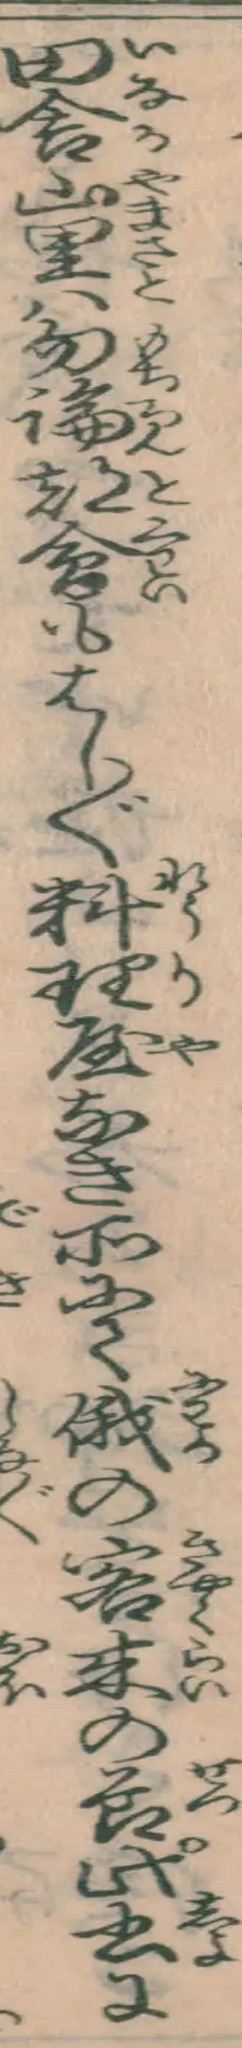田舎山里は勿論都会もはし〴〵料理屋なき所にて俄の客来の節。此書に
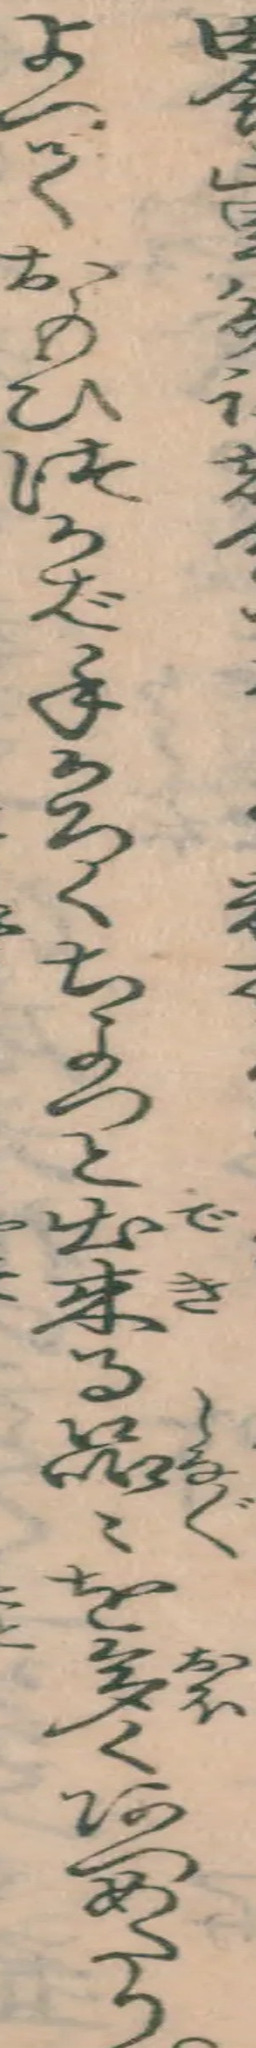よつておもひつかば手かろくちよつと出来る品々を多くあつめたり。
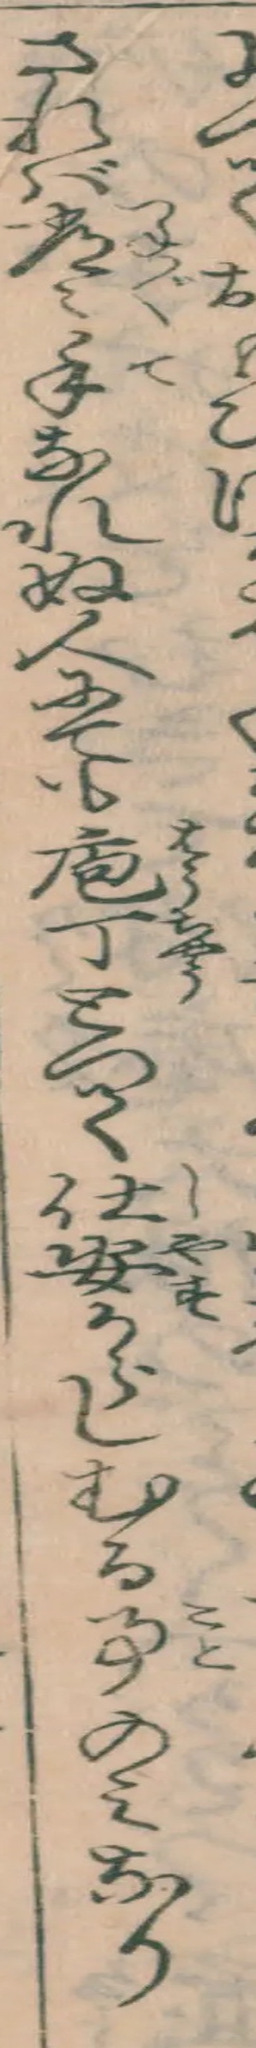されば常々手なれぬ人にても庖丁とつて仕安からしむる事のみなり
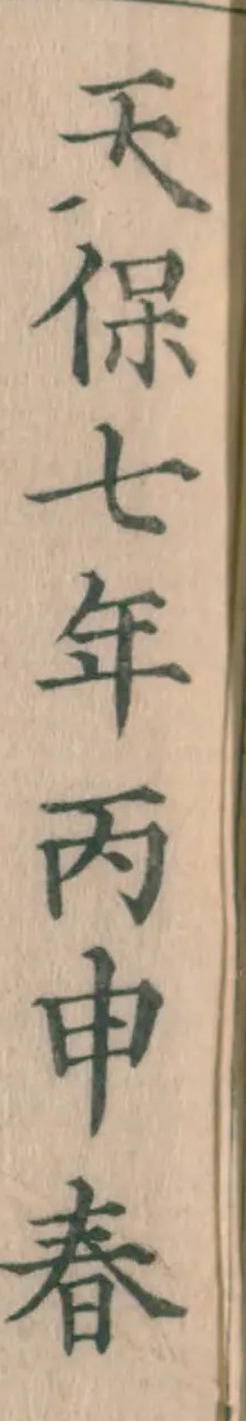天保七年丙申春
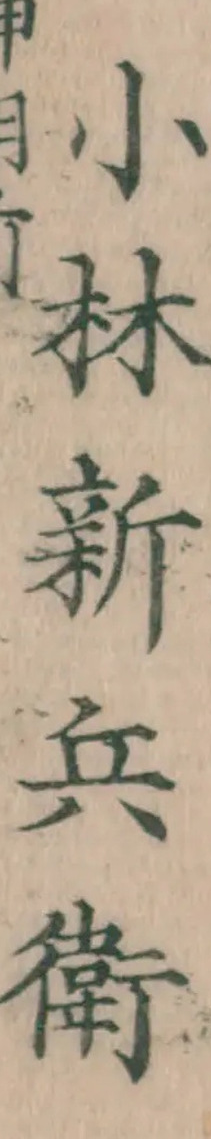小林新兵衛
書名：四季漬物鹽嘉言
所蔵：国立国会図書館 National Diet Library, JAPAN
